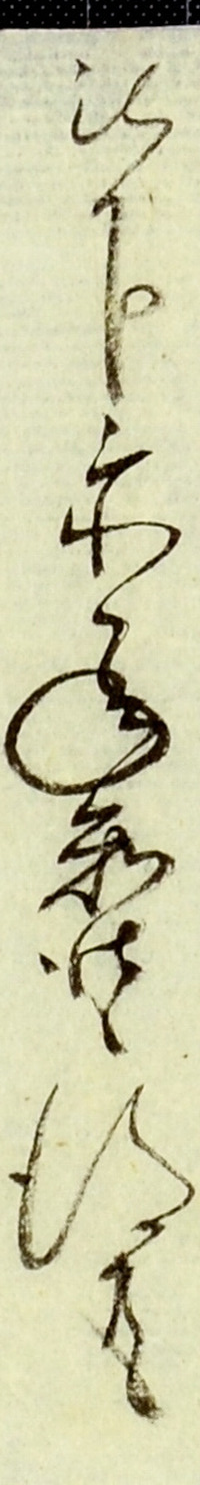被下忝承知仕候得共
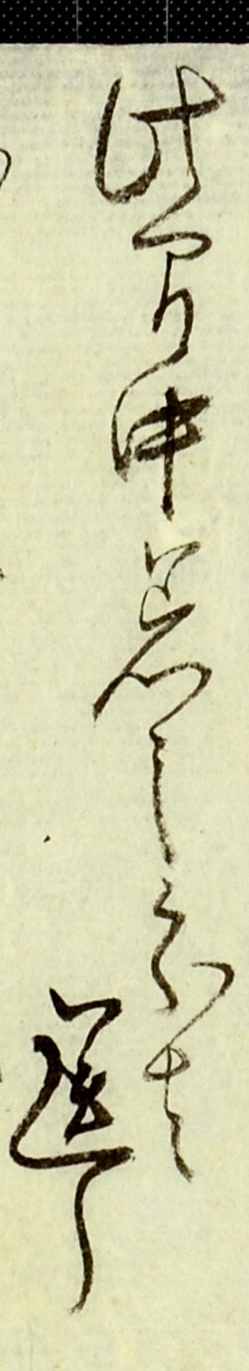此間中着之分は
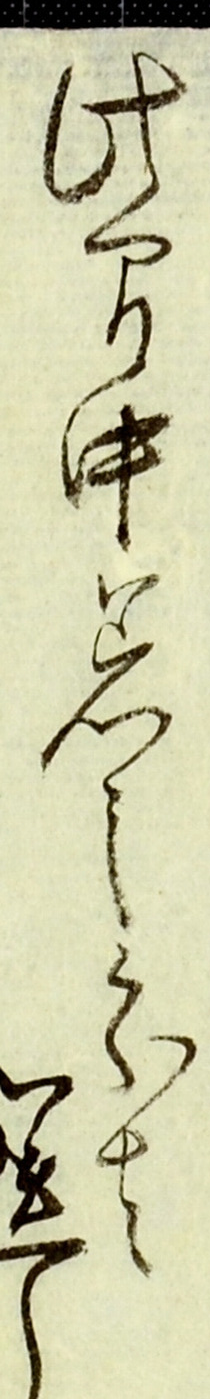此間中着之分は
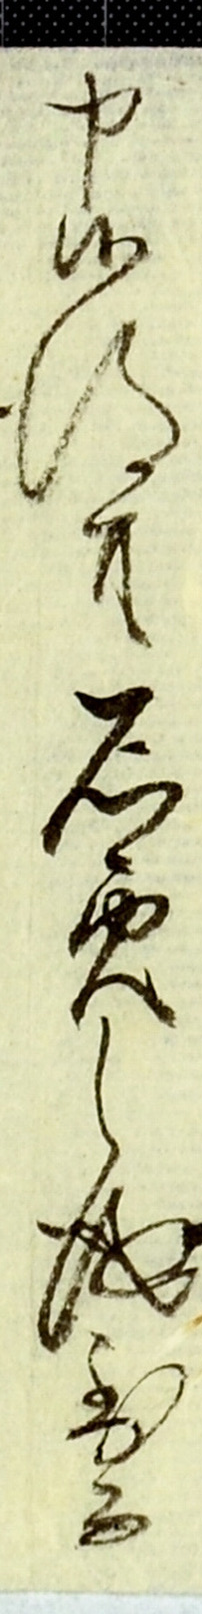申候得共石灰之儀到て
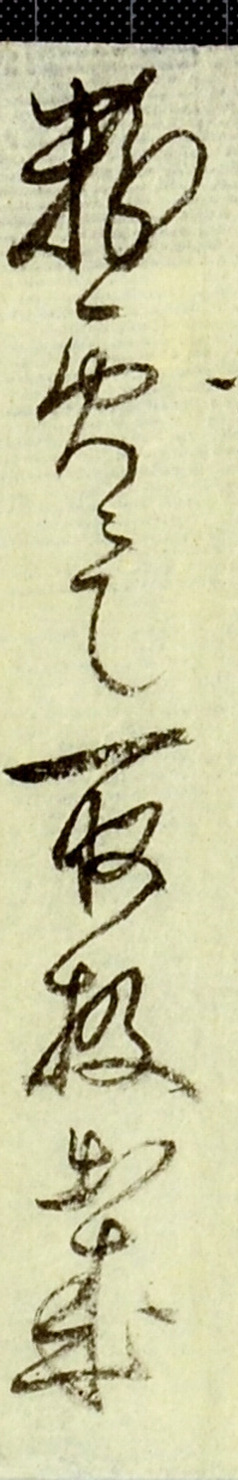粉灰にて取扱出来
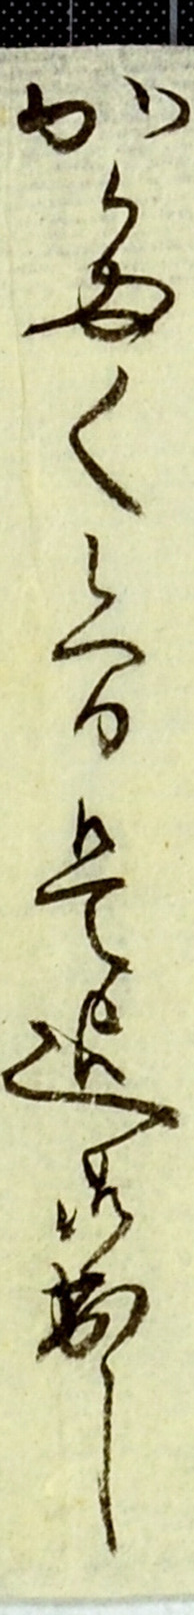かたく候間是迄御出し
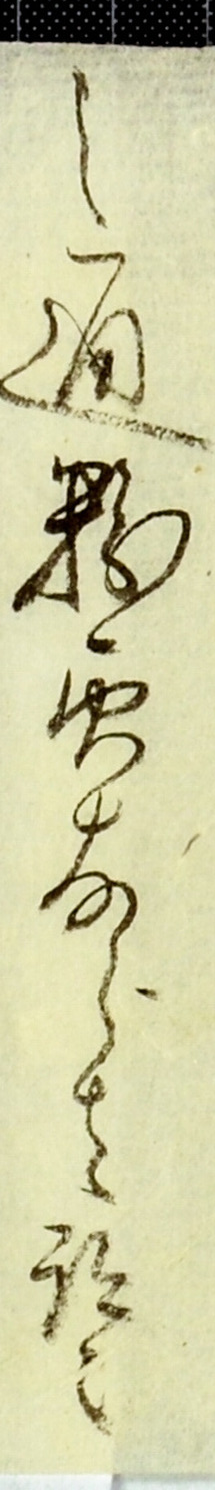之通粉灰ならは跡之
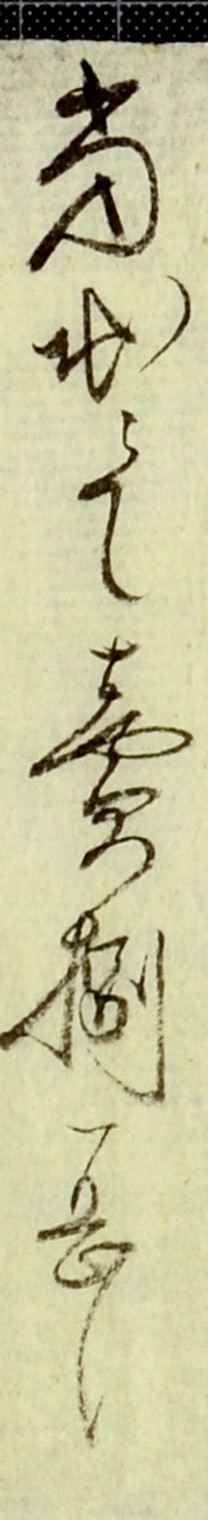当地にて売捌甚く
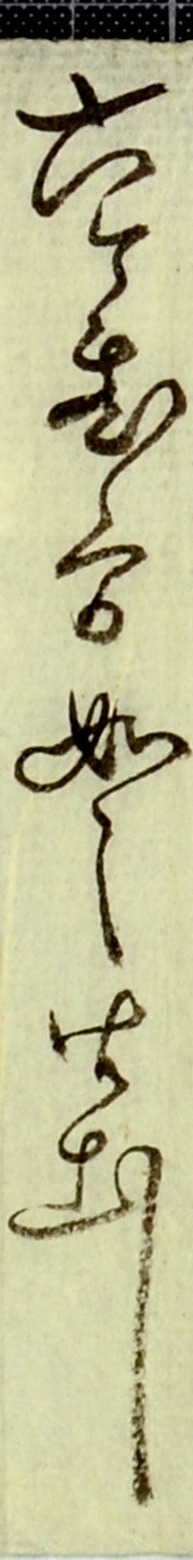六ヶ敷候間如之御出し
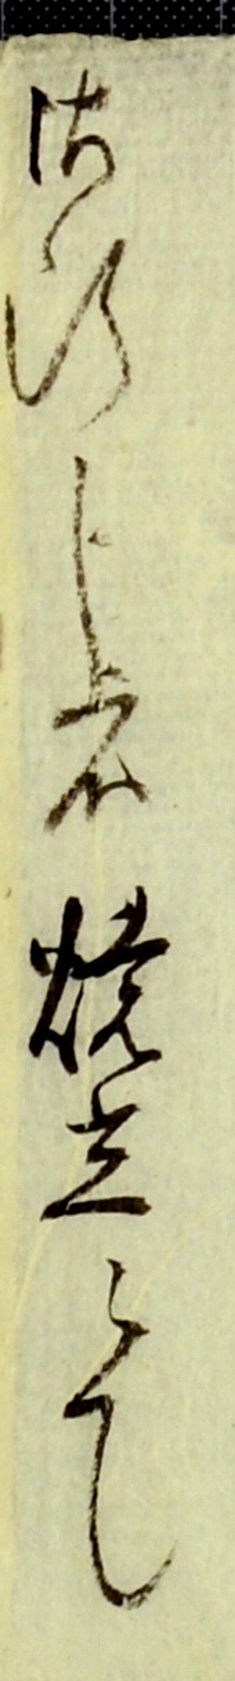御断申上候焼立にて
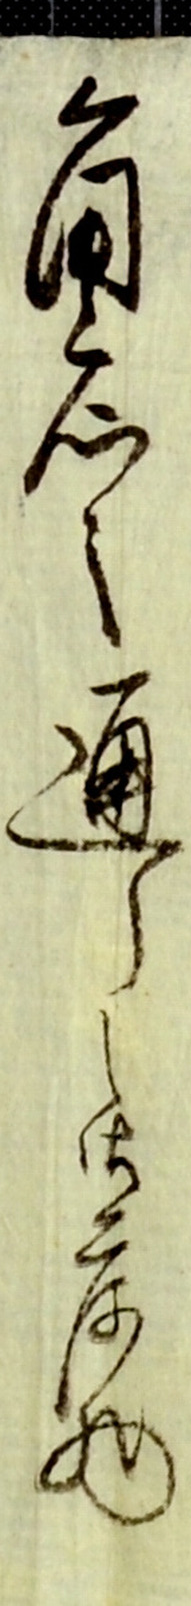角石之通り之御荷物
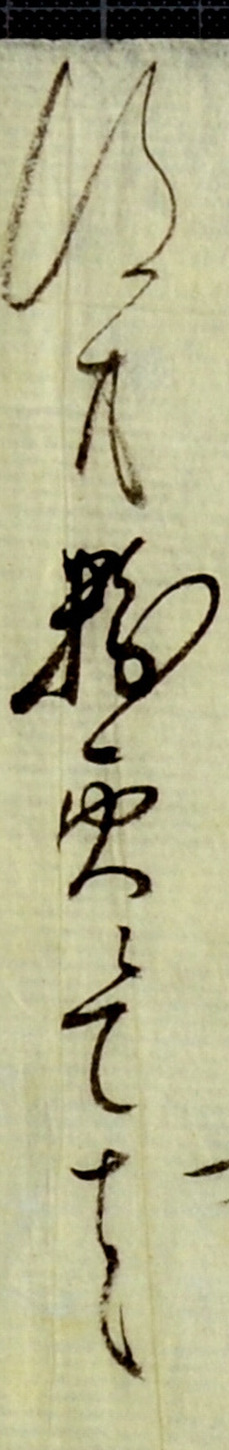得共粉灰にては
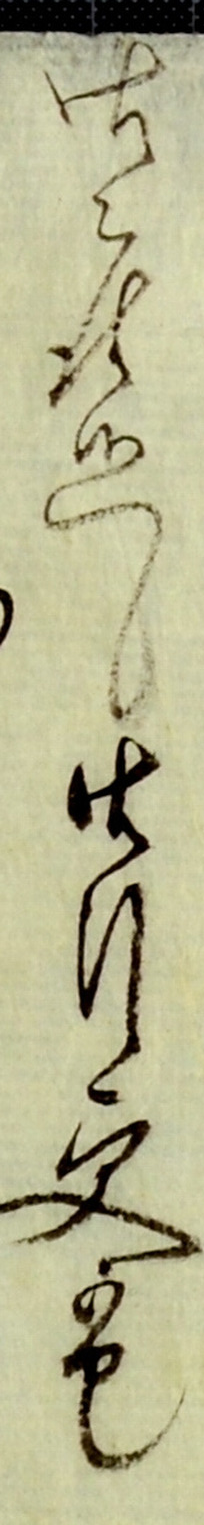御座候はゝ御引受可申候
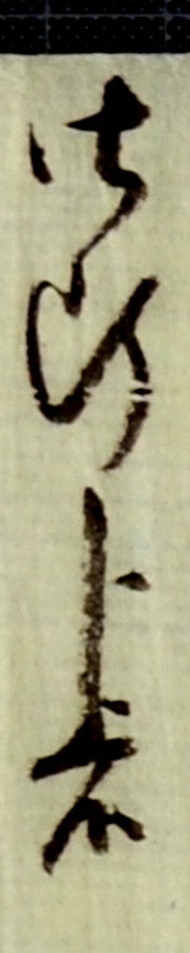御断申上候
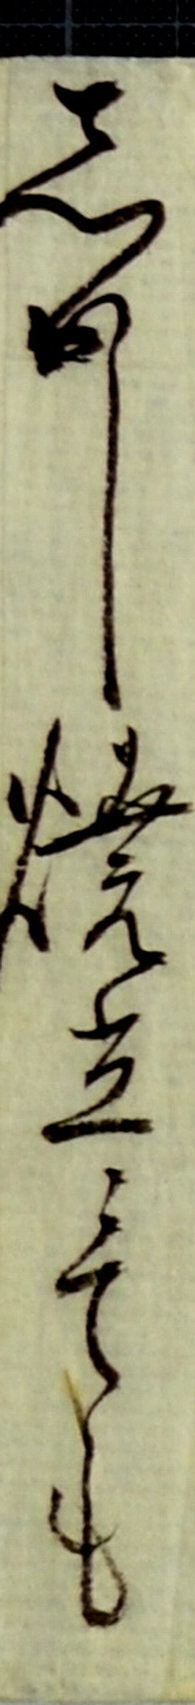しかし焼立にても

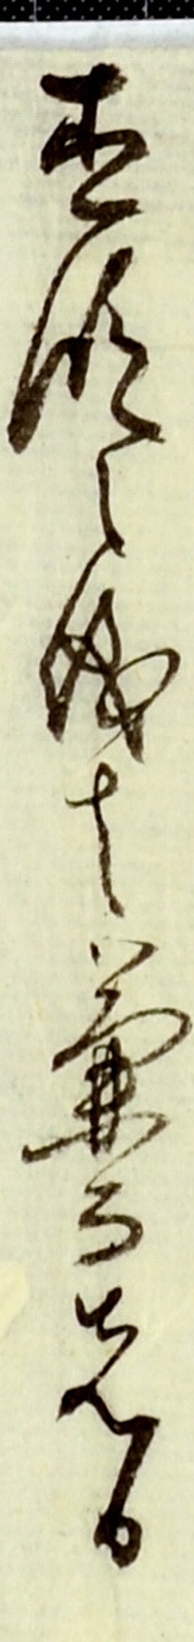直段之儀は兼て先日
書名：書状
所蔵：伊那市立高遠町図書館・合同会社AMANE
